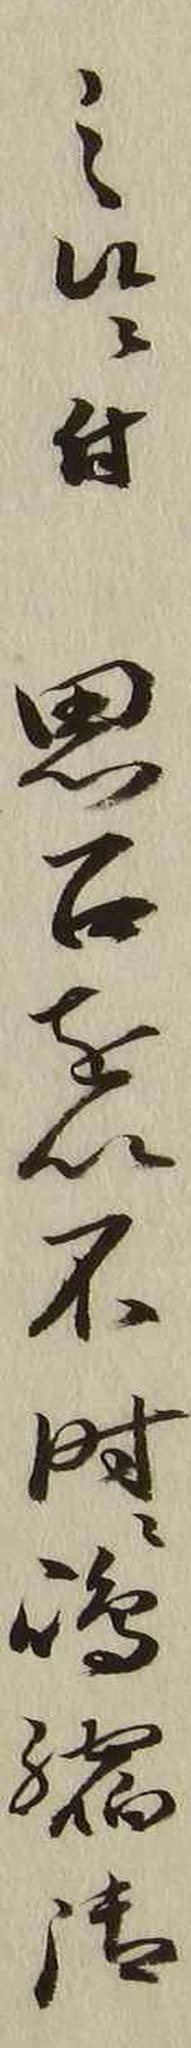之候ニ付思召を以不時ニ嶋縮御
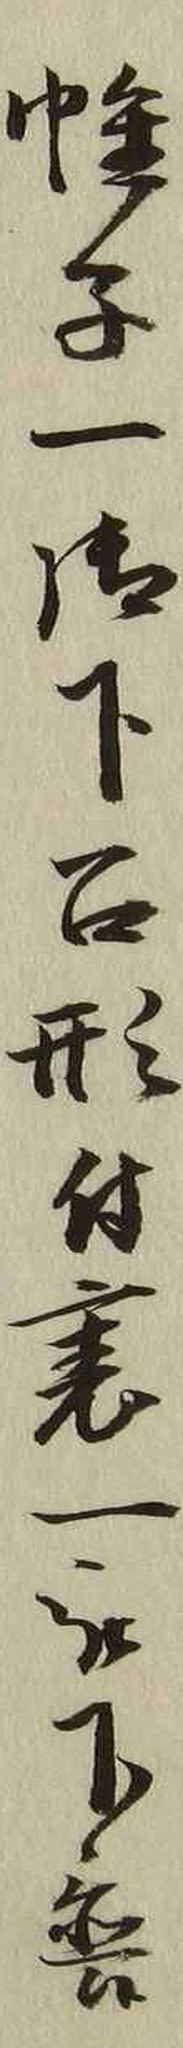帷子一御下召形付裏一被下置候
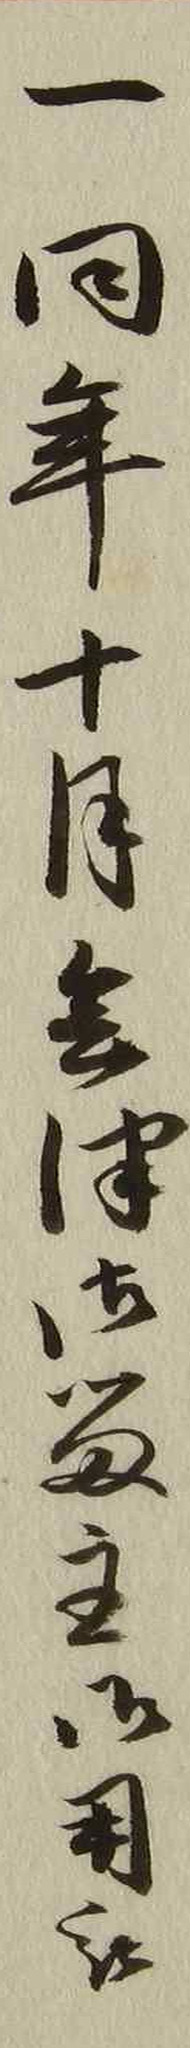一同年十月会津御留主御用被
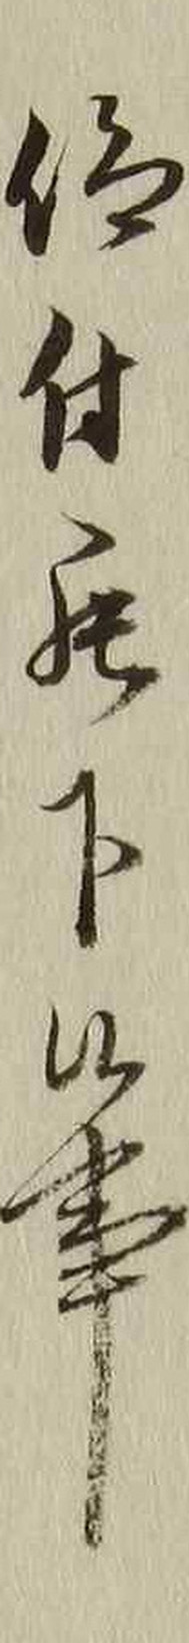仰付罷下候事
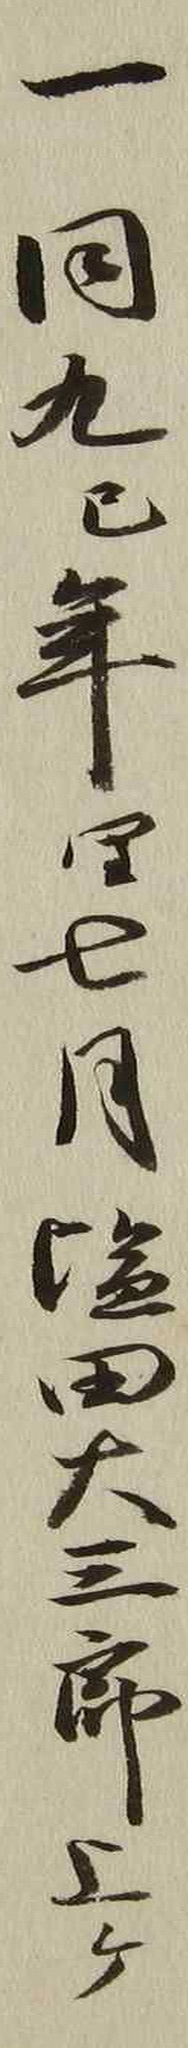一同九巳年閏七月塩田大三郎上ヶ
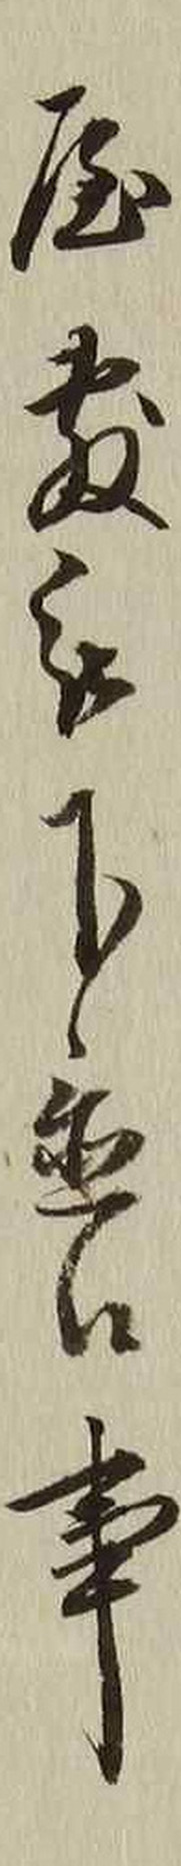屋敷被下置候事
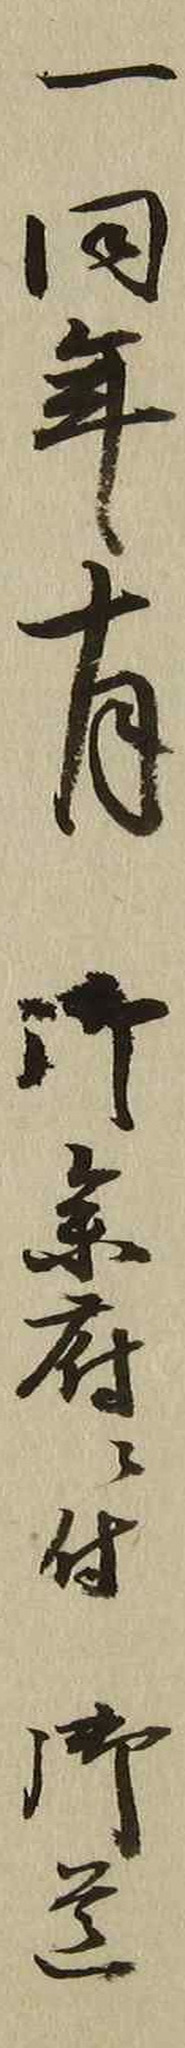一同年十月御参府ニ付御道
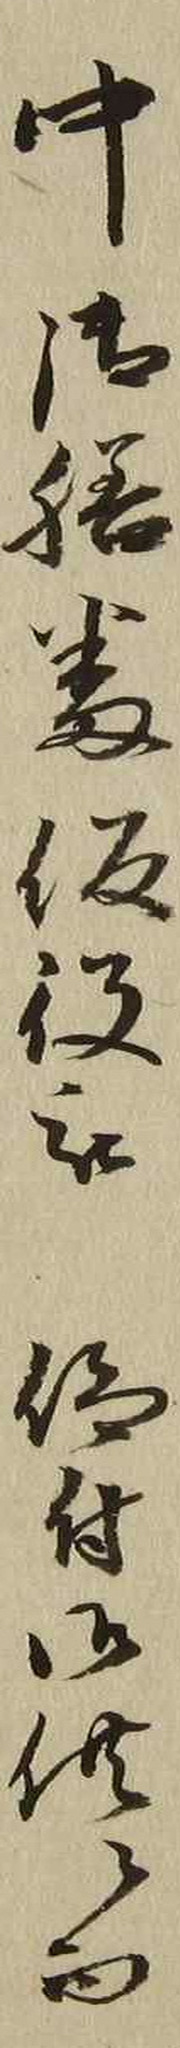中御膳番仮役被仰付御供ニ而
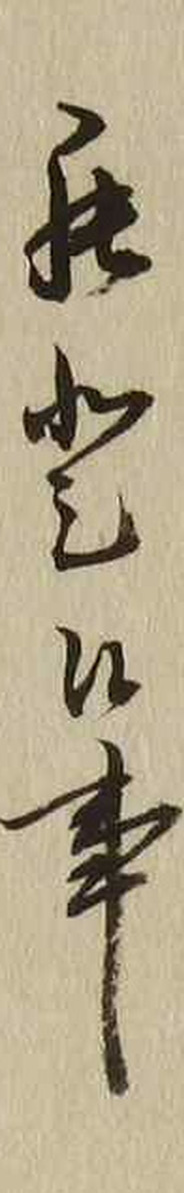罷登候事
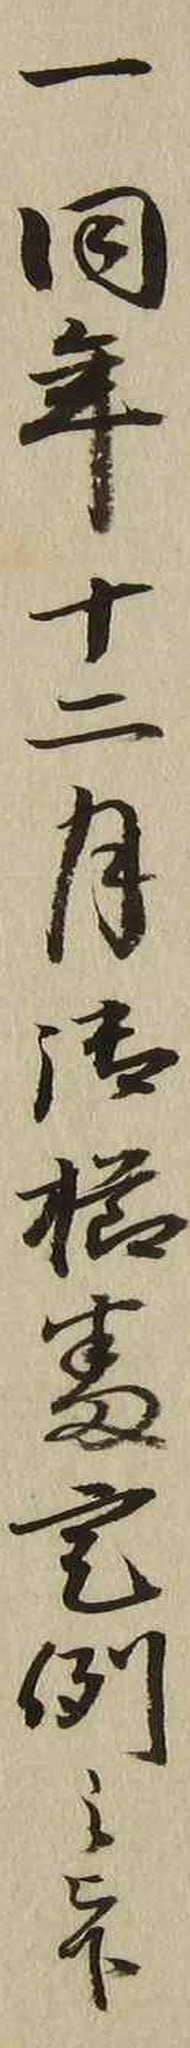一同年十二月御櫛番定例之被下
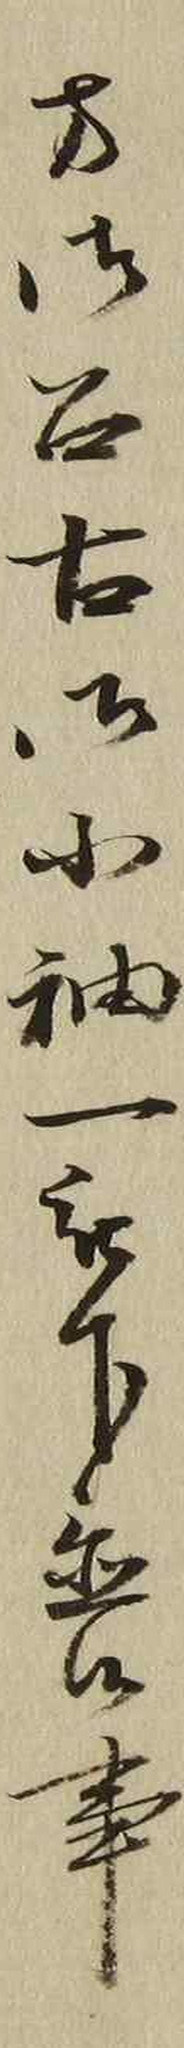方御召古御小袖一被下置候事
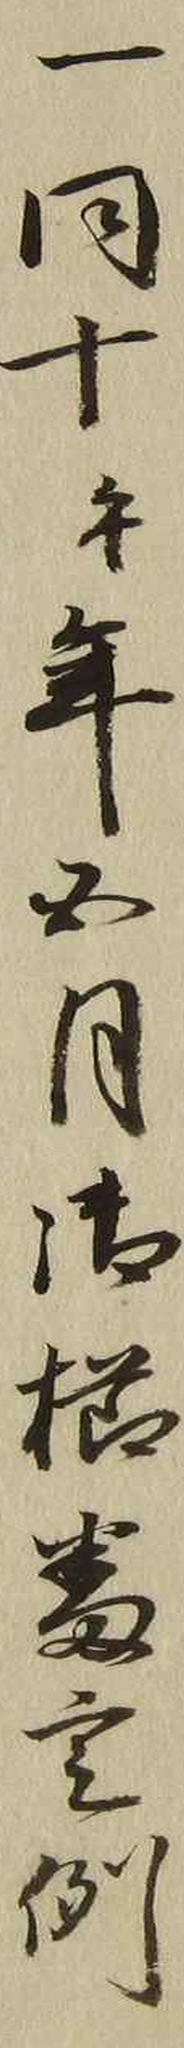一同十午年五月御櫛番定例
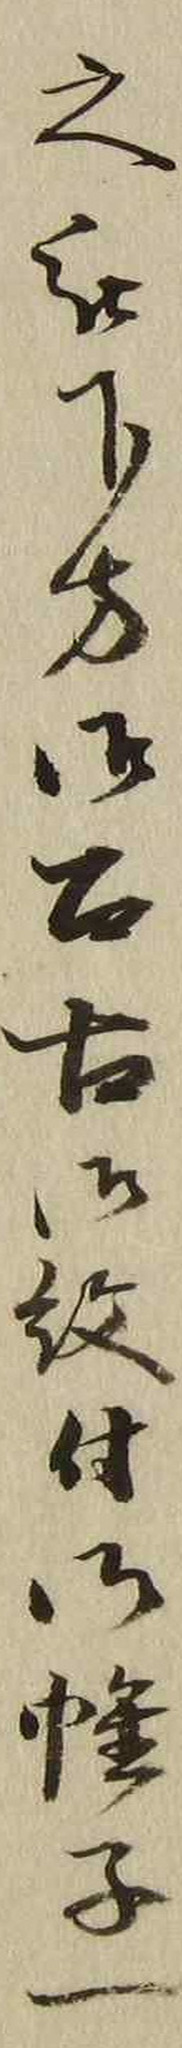之被下方御召古御紋付御帷子一
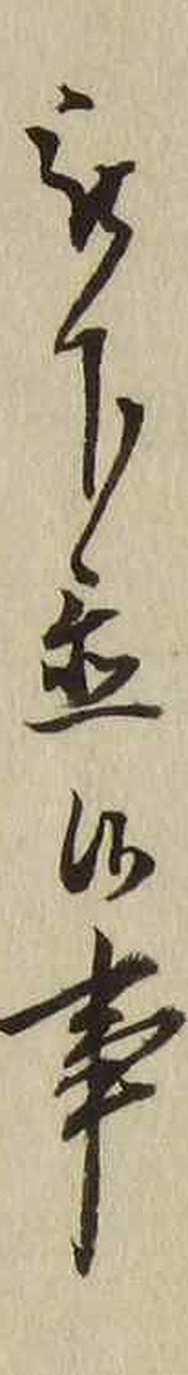被下置候事
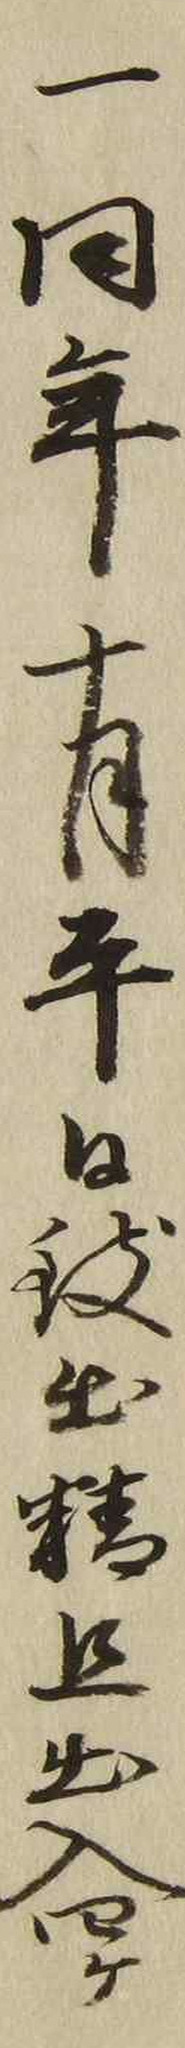一同年十月平日致出精且出入四ヶ
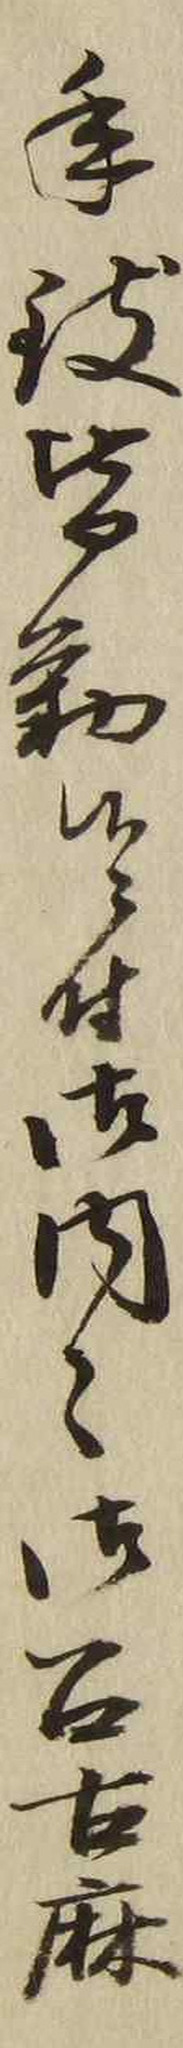年致皆勤候ニ付御内々御召古麻
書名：諸士系譜　巻之61　と之部4
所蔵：会津若松市立会津図書館
